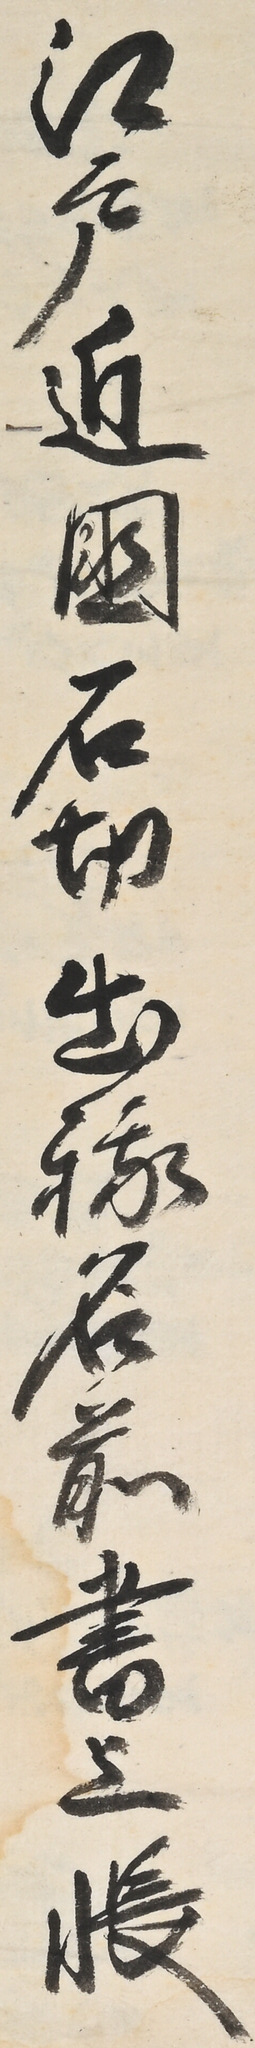江戸近国石切出稼名前書上帳
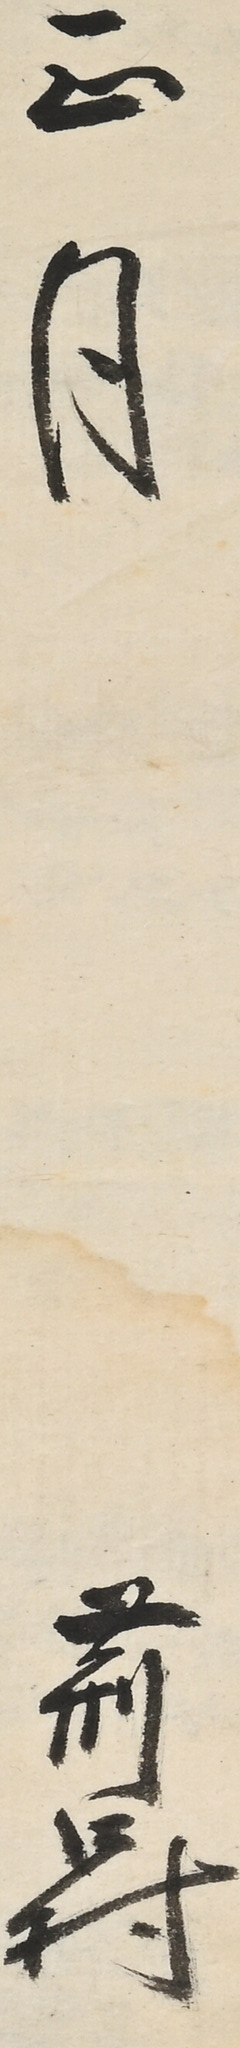正月荊口村

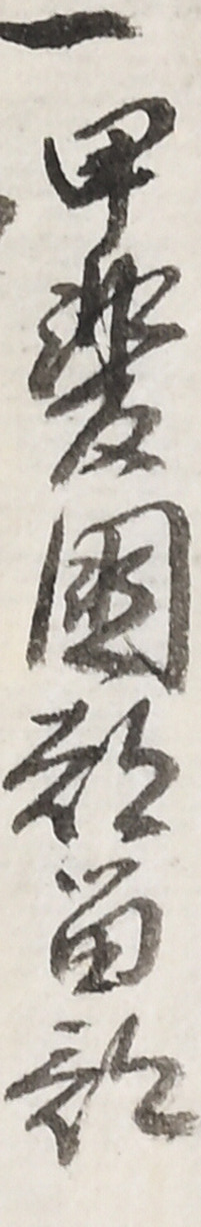一甲斐国都留郡
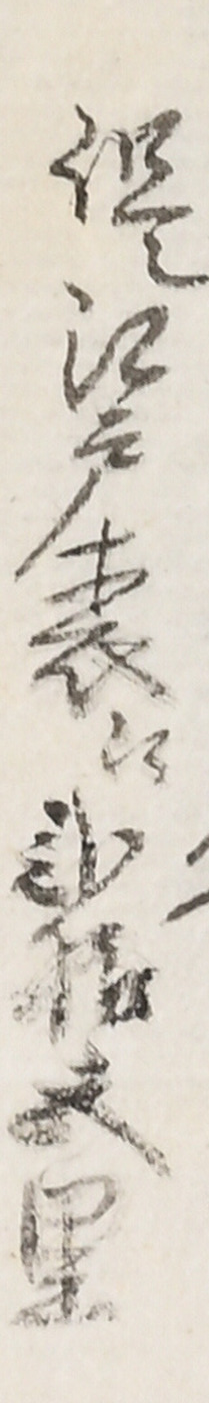但し江戸表え弐拾五里
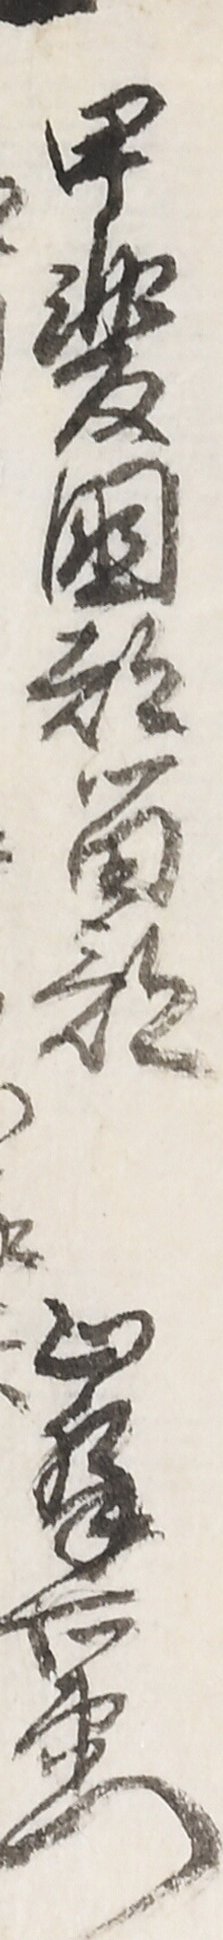一甲斐国都留郡峯右衛門
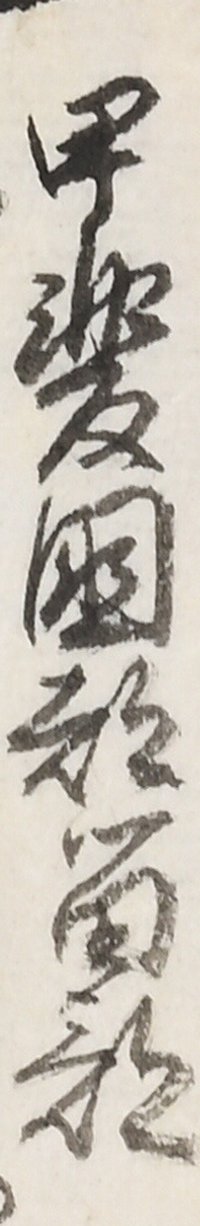一甲斐国都留郡
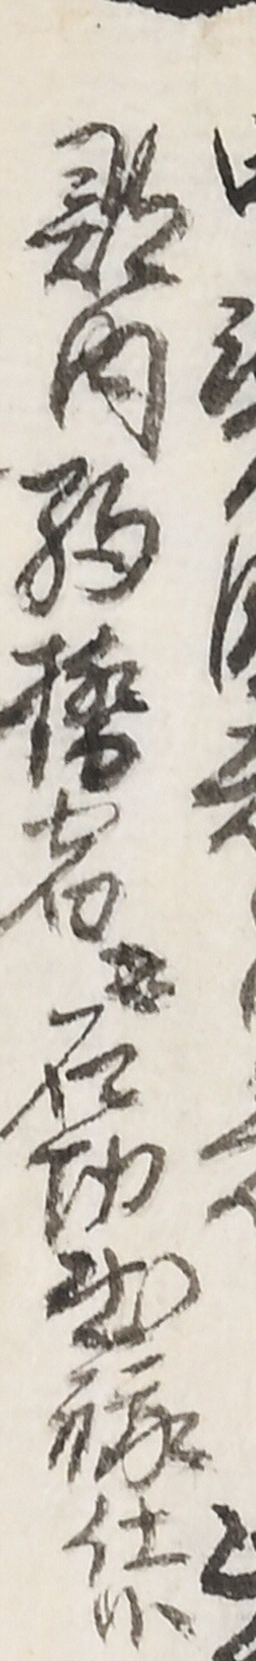郡内駒橋宿え石切出稼仕候
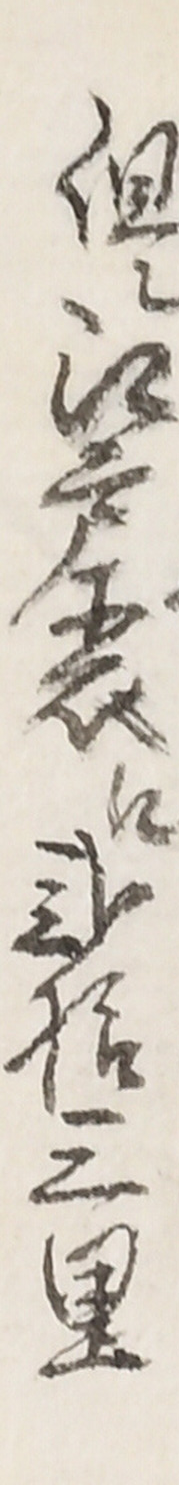但し江戸表え弐拾三里
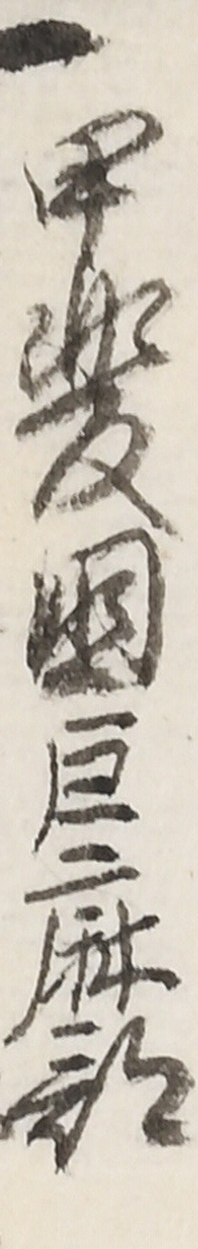一甲斐国巨摩郡
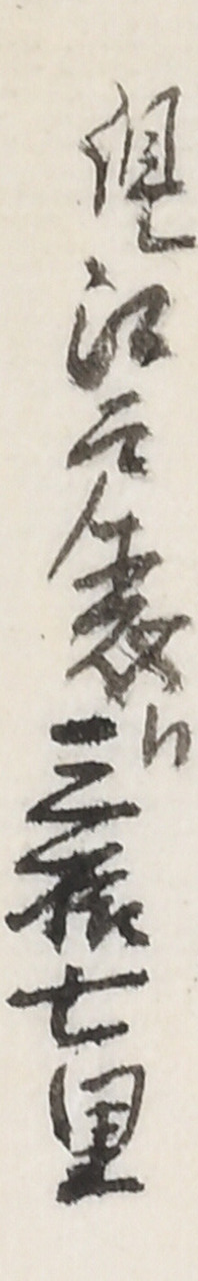但し江戸表え三拾七里
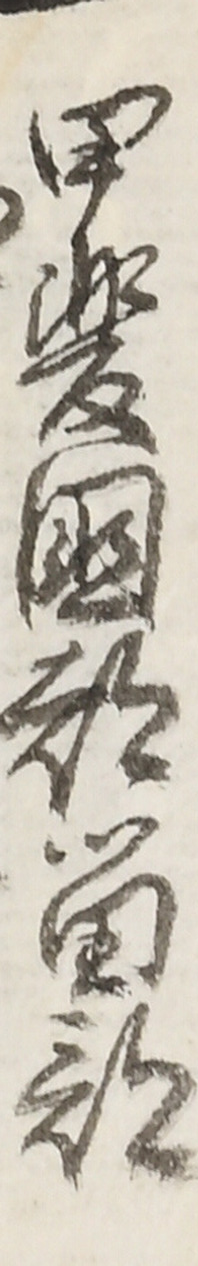一甲斐国都留郡
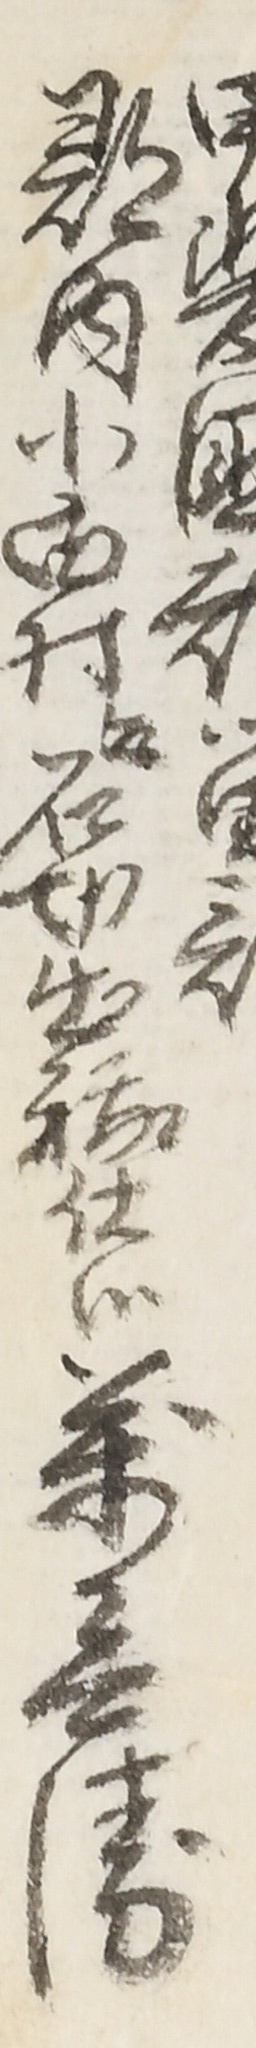郡内小向村え石切出稼仕候万兵衛
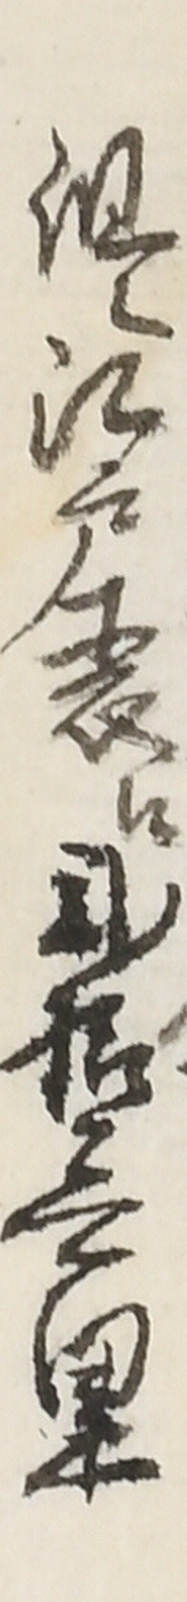但し江戸表え弐拾壱里
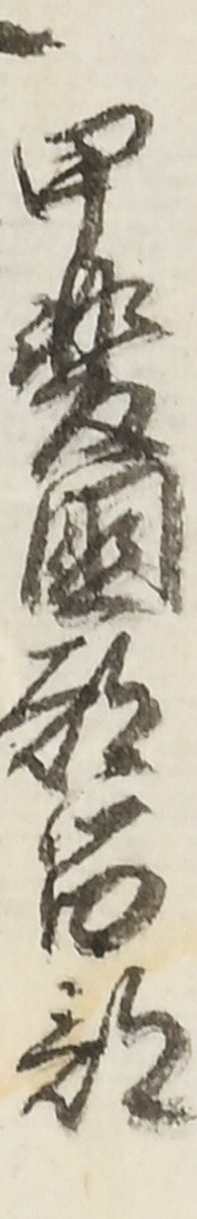一甲斐国都留郡
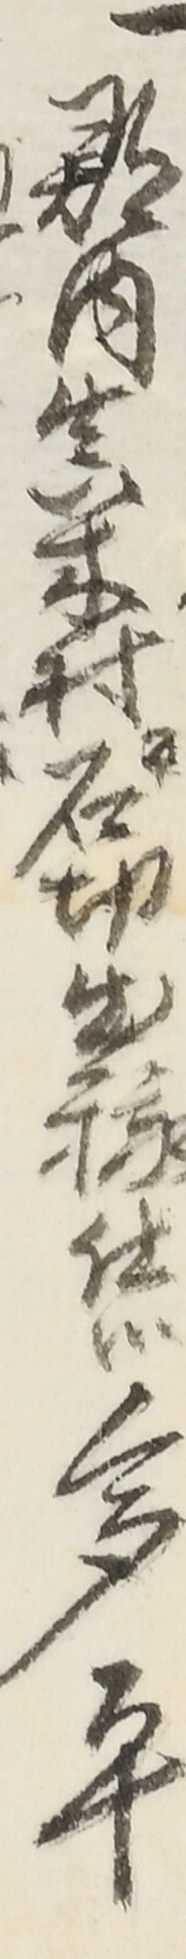郡内真木村ニ石切出稼仕候多平
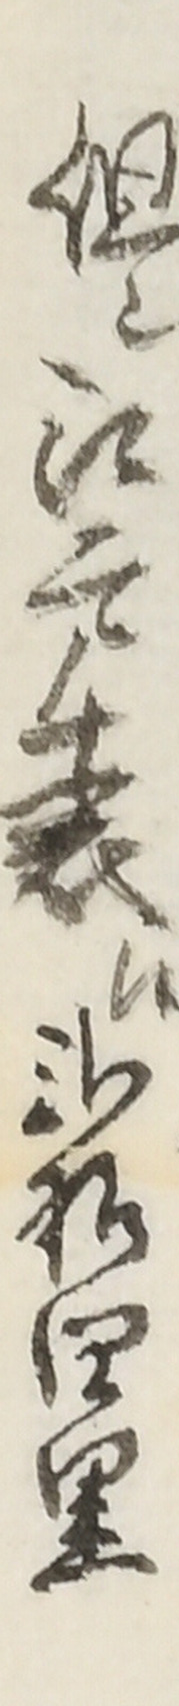但し江戸表え弐拾四里
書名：嘉永五壬子年正月江戸近國石切出稼名前書上帳
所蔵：伊那市立高遠町図書館・合同会社AMANE
